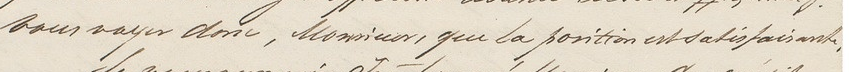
vous voyez donc, Monsieur, que la position est satisfaisant.
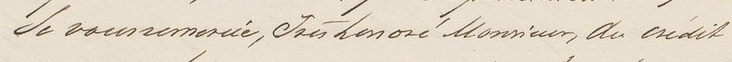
Je vous remercie, Très honoré Monsieur, du crédit
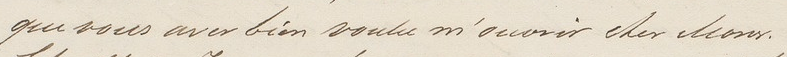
que vous avez bien voulu m'ouvrir cher Mons.
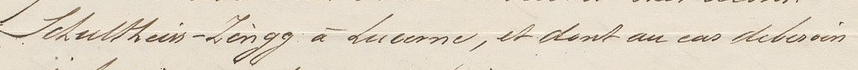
Schultheiss-Zingg à Lucerne, et dont au cas de besoin
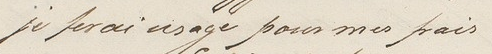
je ferai usage pour mes frais.
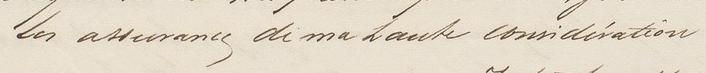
les assurances de ma haute considération
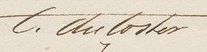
C. du Coster
